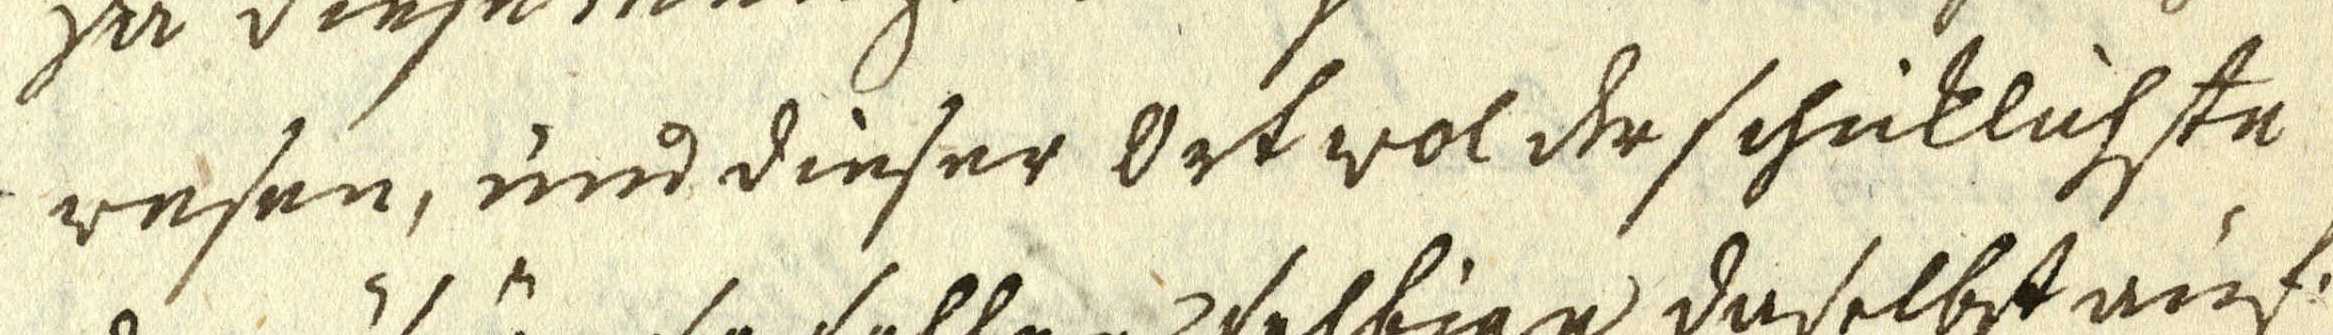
wesen, und dieser Ort wol der schicklichste
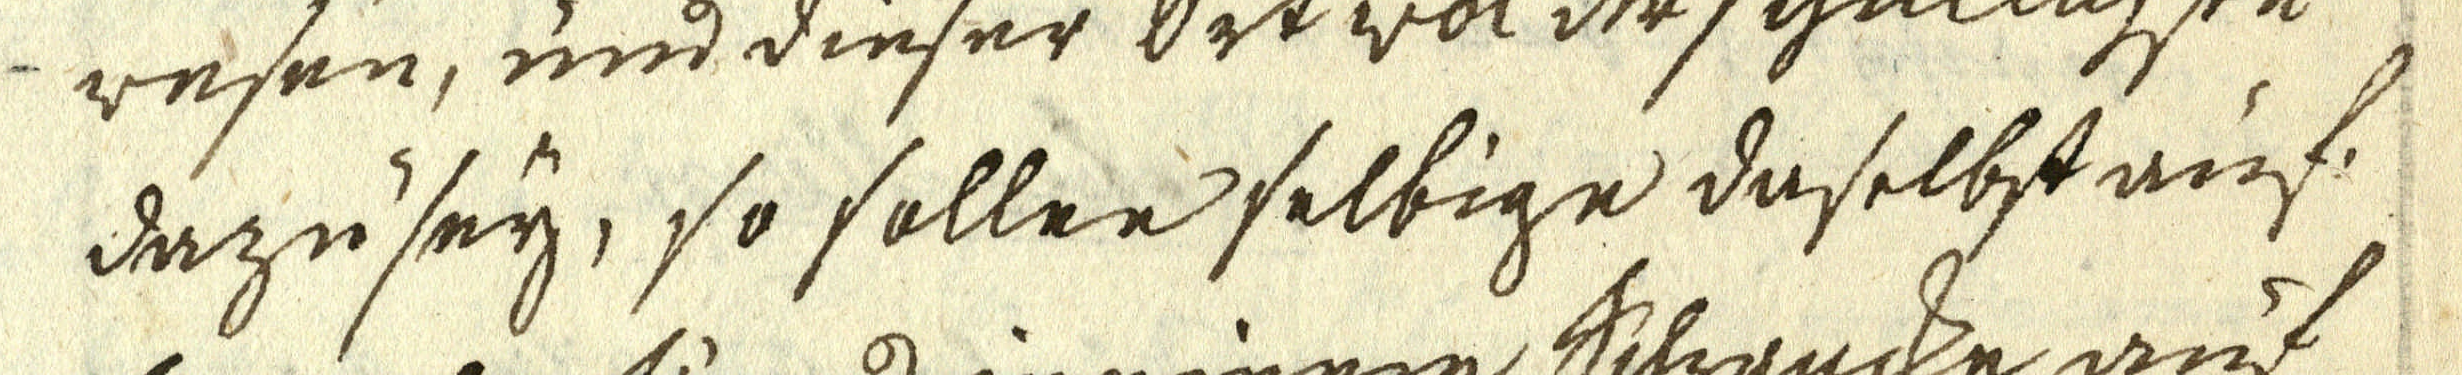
dazu seÿ, so sollen selbige daselbst auf¬
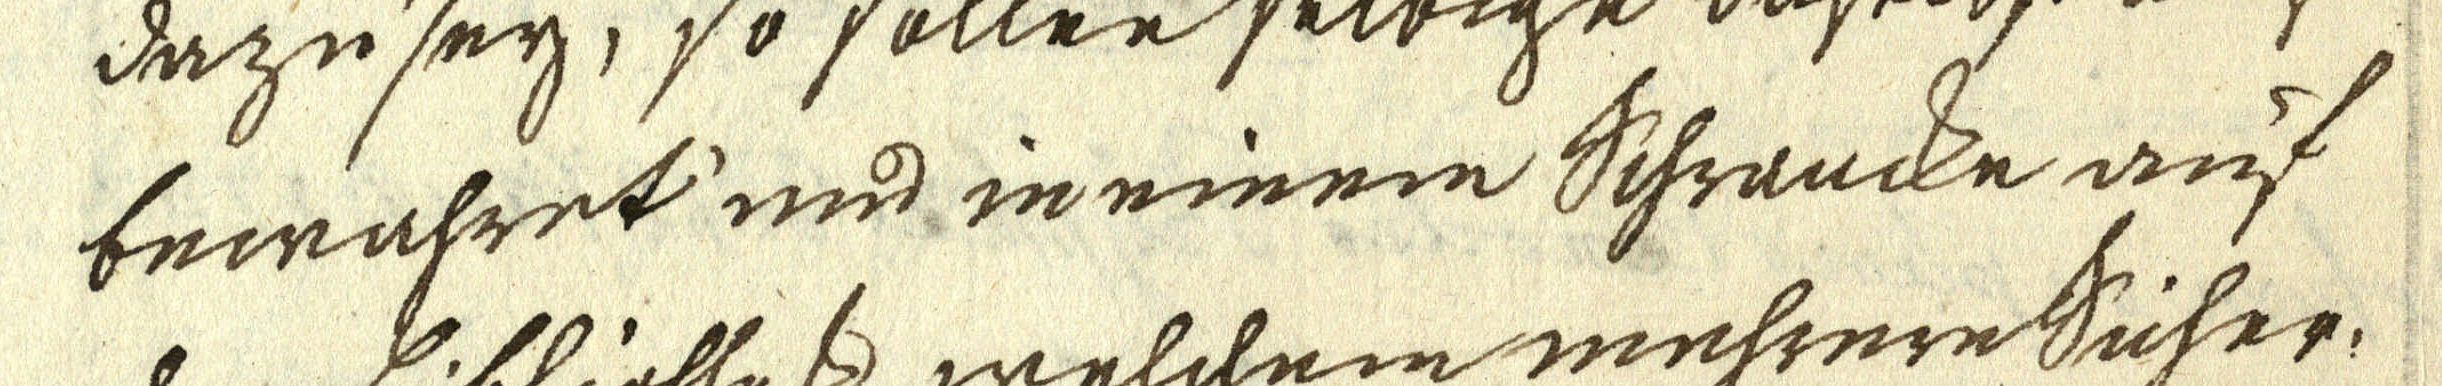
bewahret und in einem Schrancke auf
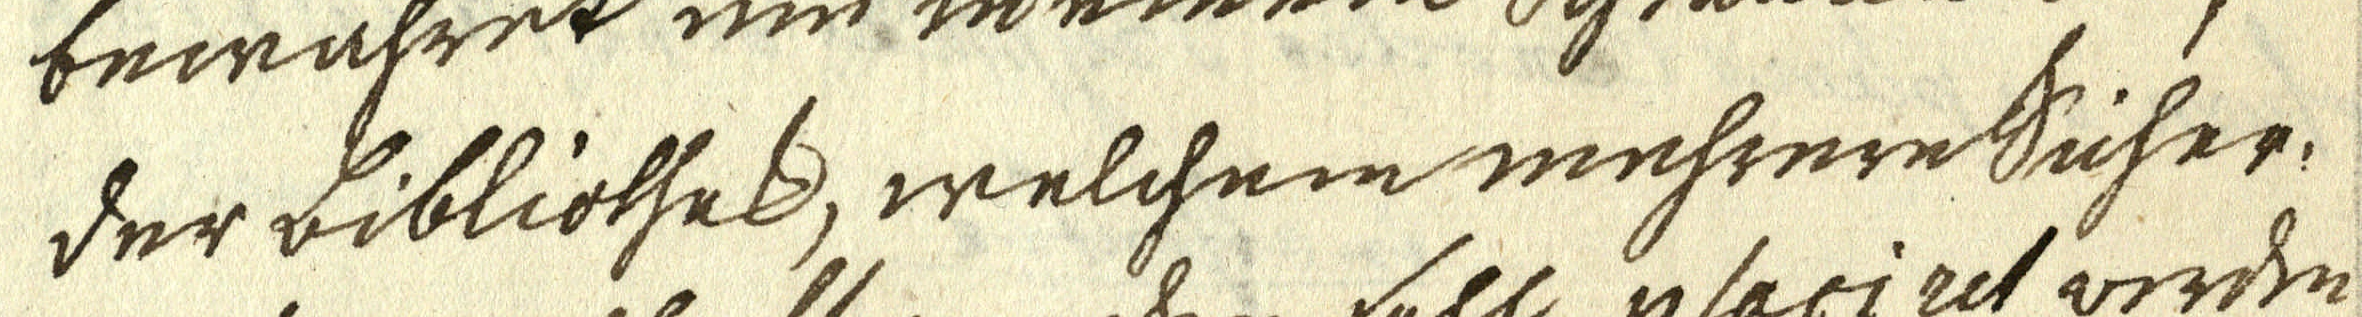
der Bibliothek, welchem mehrere Sicher¬
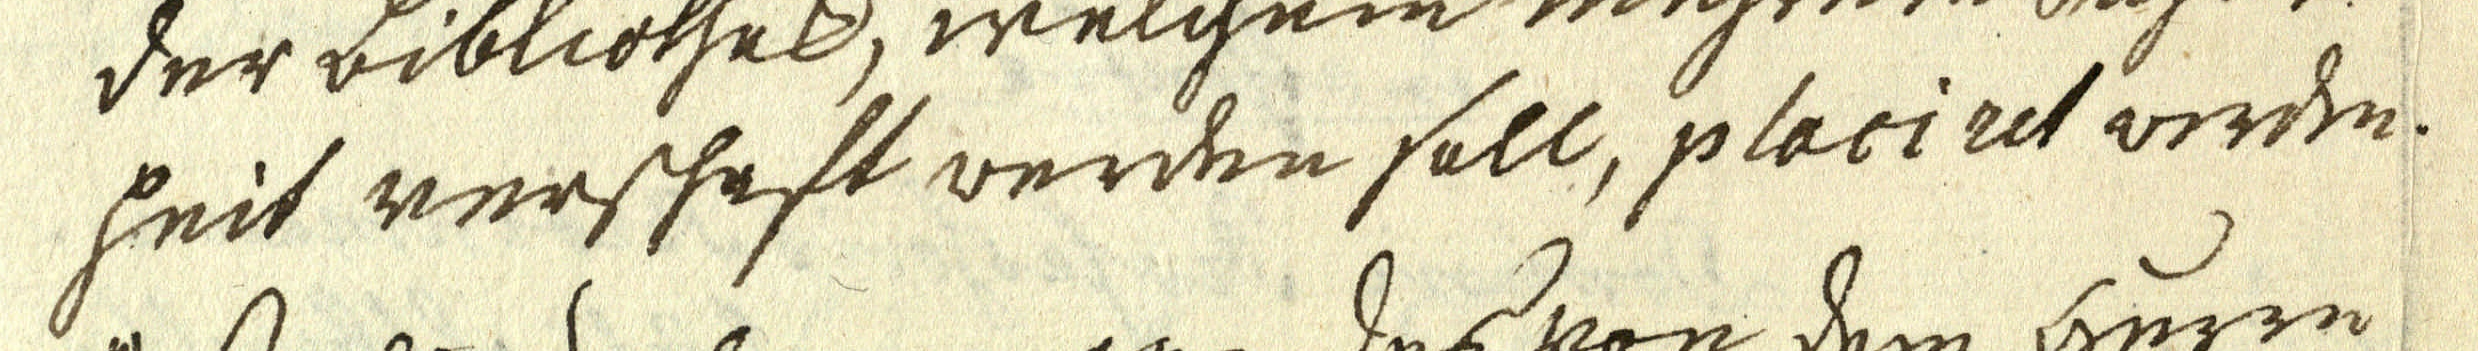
heit verschaft werden soll, placiret werden.
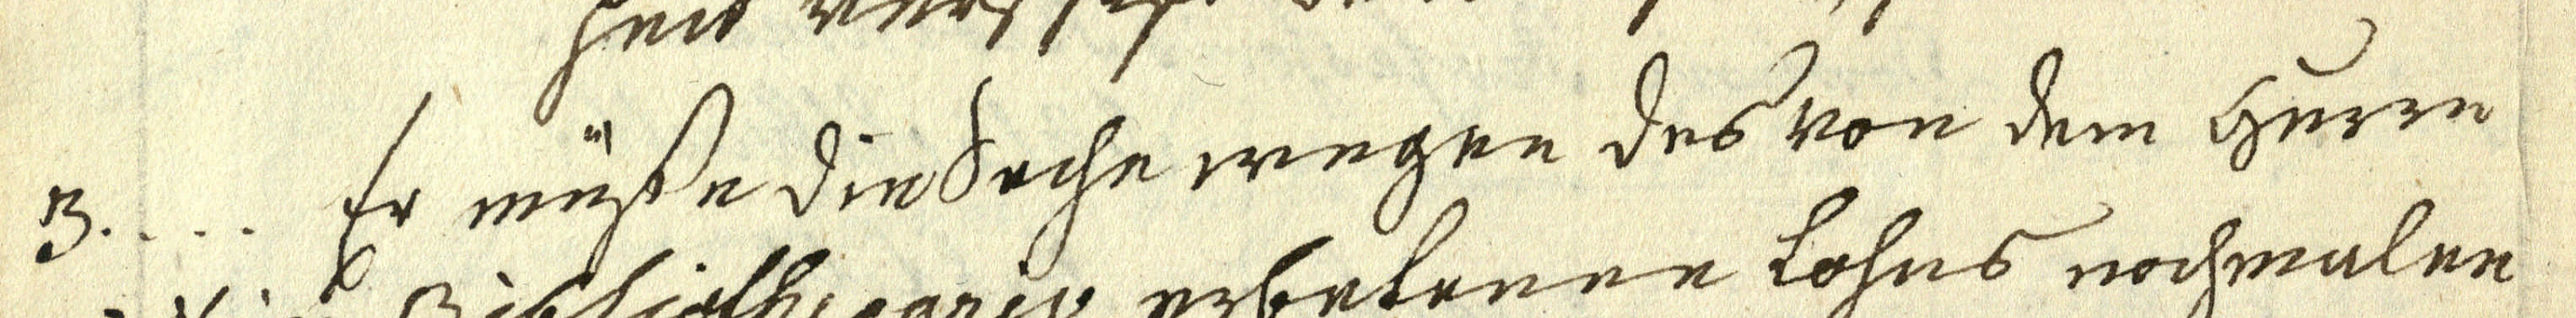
3. Er müße dieSache wegen des von dem Herrn
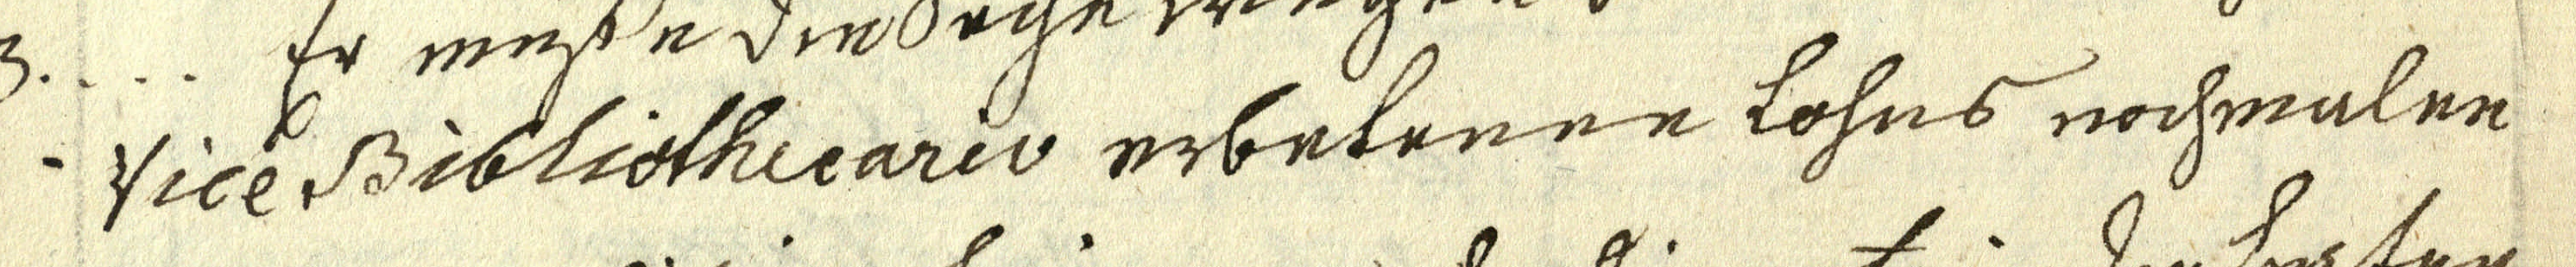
Vice Bibliothecario erbetenen Lohns nochmalen
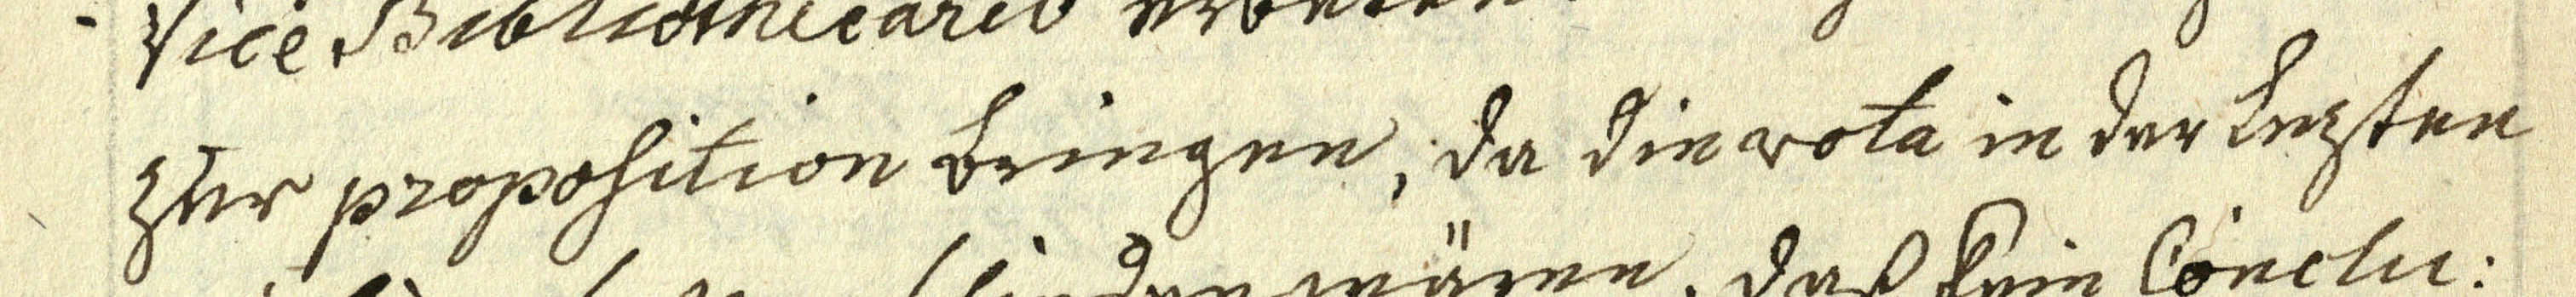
zur proposition bringen, da die vota in der lezten
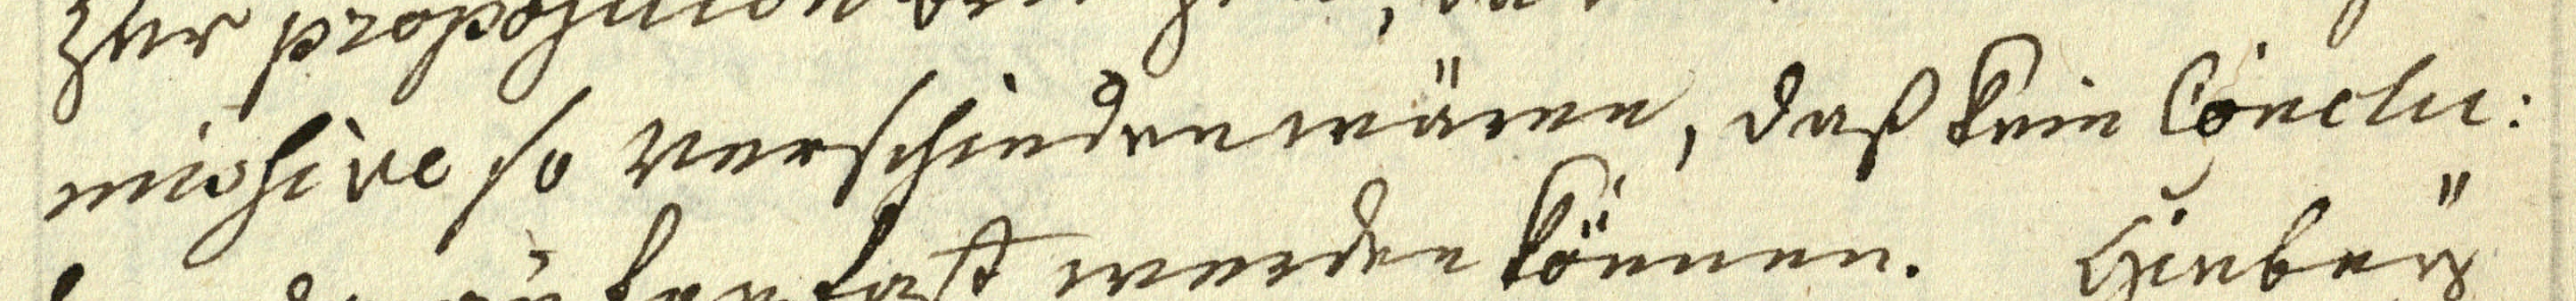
missive so verschieden wären, daß kein Conclu¬
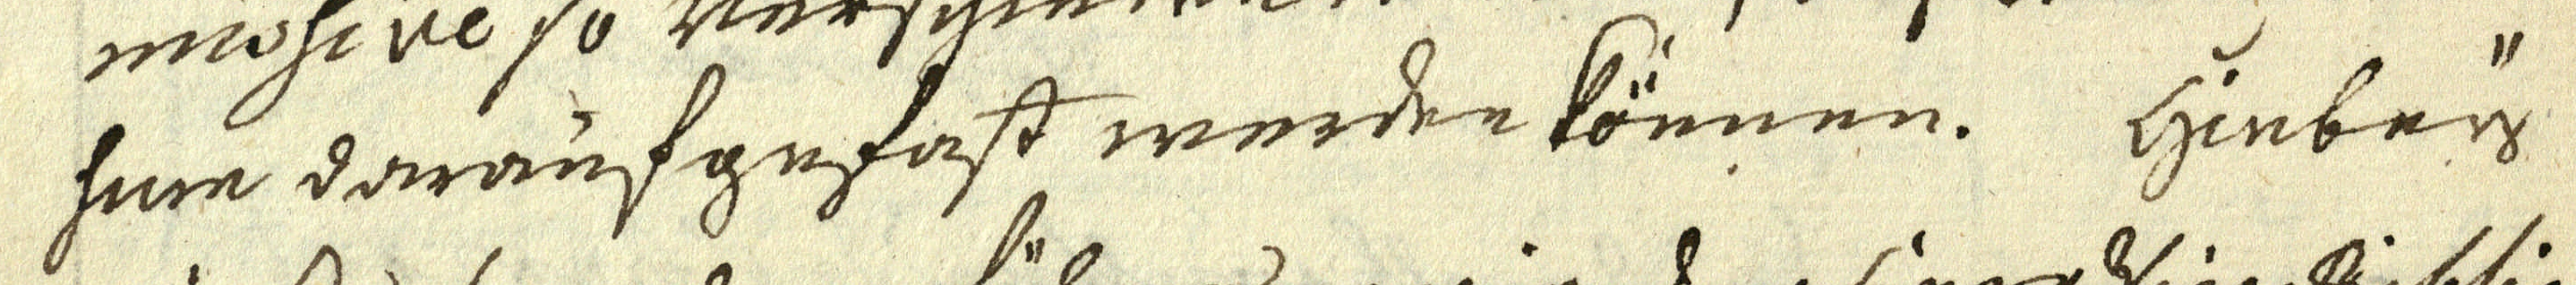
sum darauf gefast werden können. Hiebeÿ
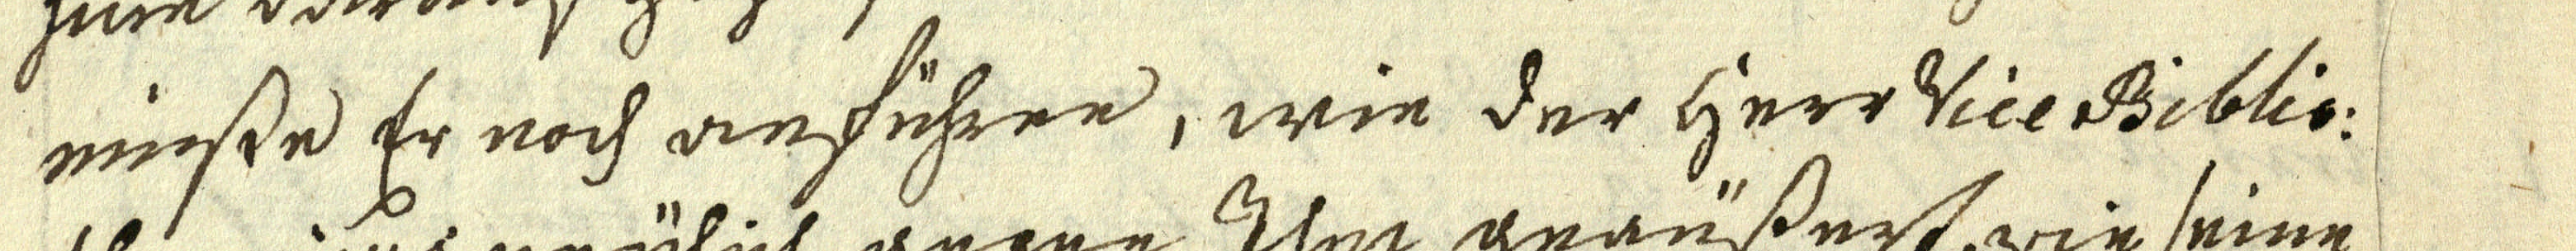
müße Er noch anführen, wie der Herr Vice Biblio¬
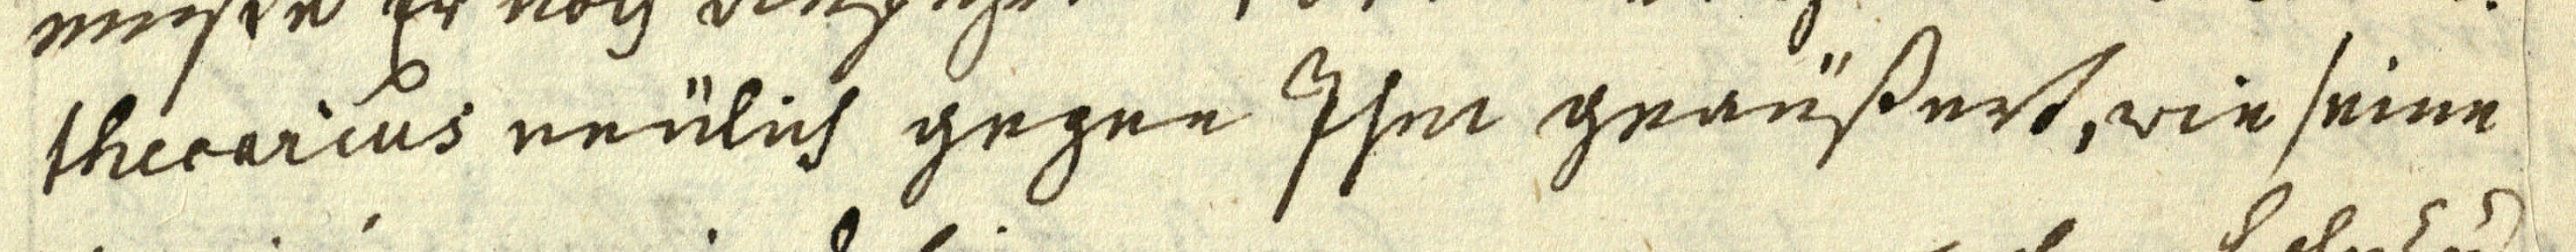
thecarius neulich gegen Ihm geäußert, wie seine
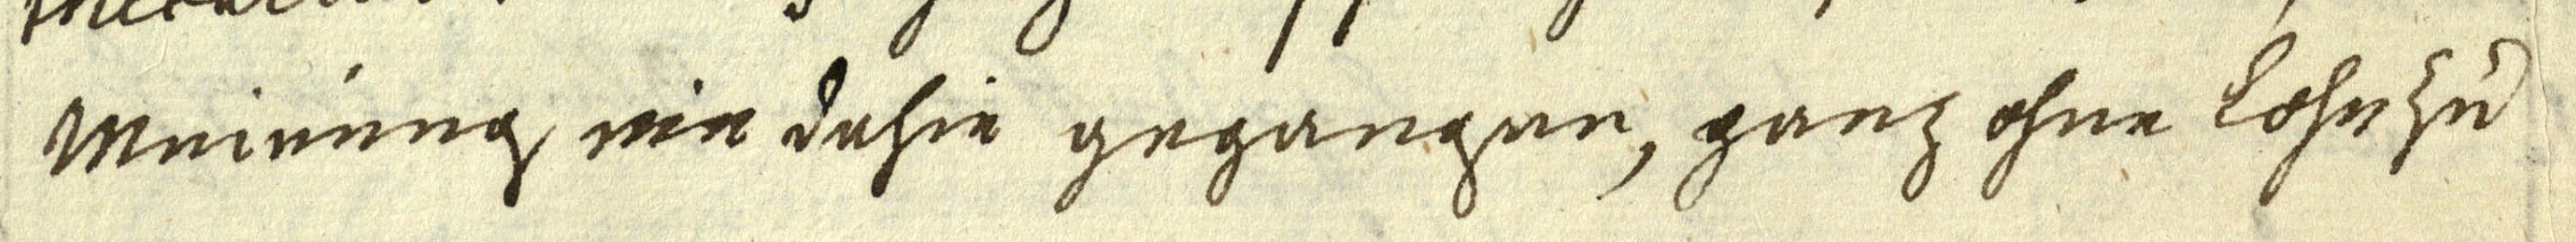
Meinung nun dahin gegangen, ganz ohne Lohn zu
